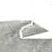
daß aber
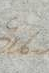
die
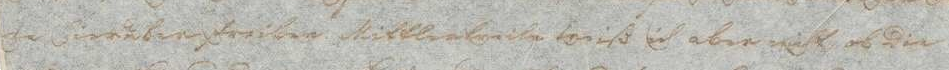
che hierüber schreiben. Mittlerweile weiß ich aber nicht, ob die
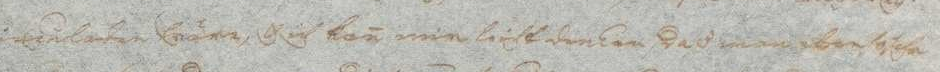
einzuladen wäre, & ich kann mir leicht denken, daß man ebensosehr
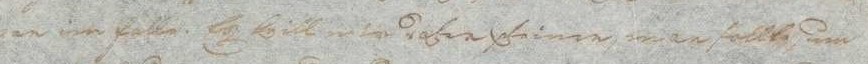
sagen im Falle. Es will mir daher scheinen, man sollte, um
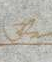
eine
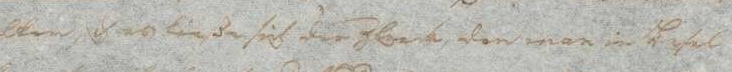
veranstalten, & es ließe sich der Zweck, den man in Basel
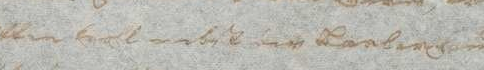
dung, welche einen privaten Character
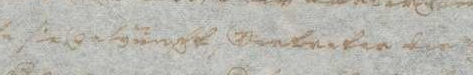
haben würde, erreichen. Bei
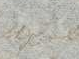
dieser
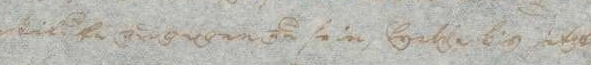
Unterredung hätten wohl nebst der Basler Handelsbank &
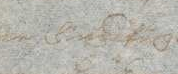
der Aargauischen
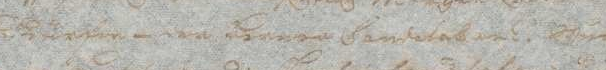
auf Beschlüsse, welche voraussichtlich Morgen werden gefaßt
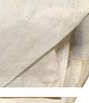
der
